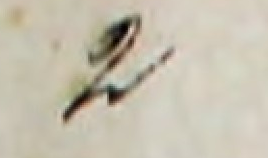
2
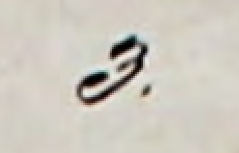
3.
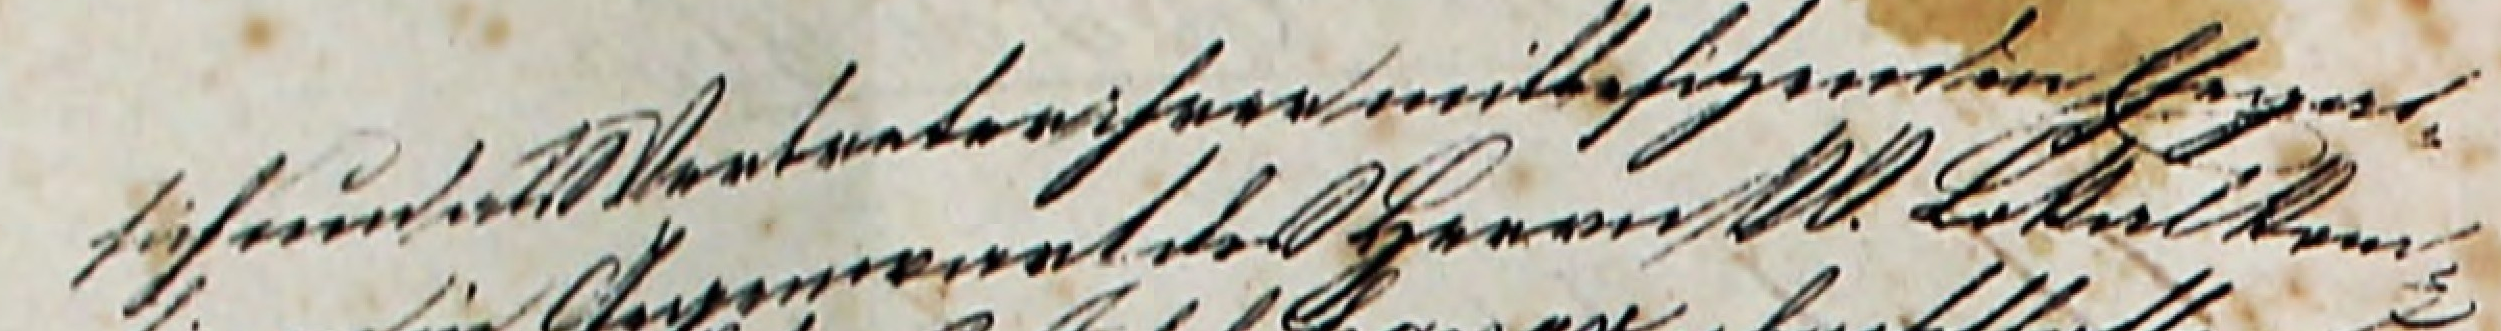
sichundats Vertreter ihrer mitbesitzenden Ehegat
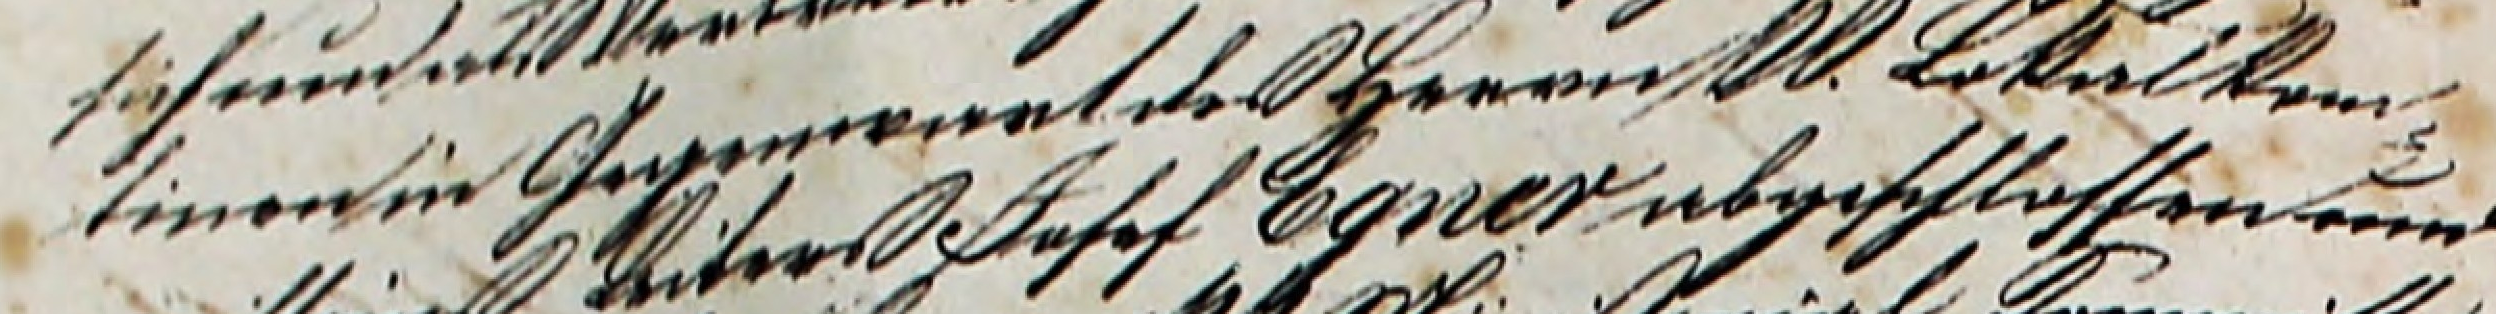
tinen in Gegenwant des Herrn kk. Lokalkom„
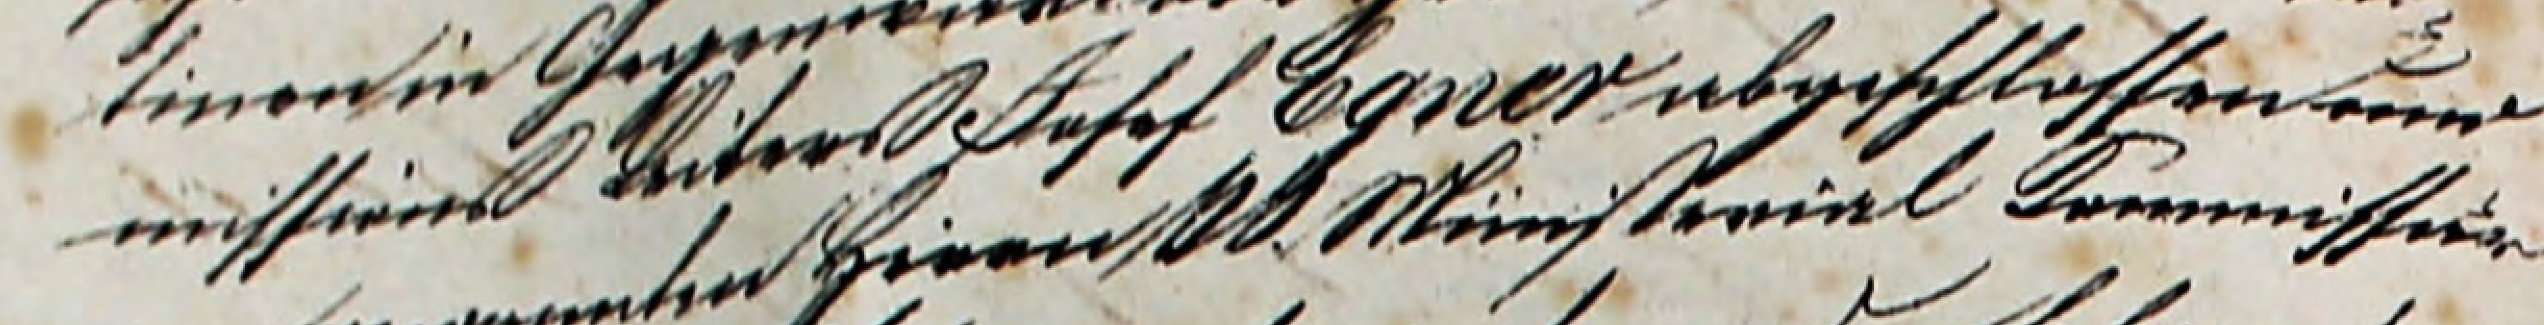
missions Reiters Josef Egner abgeschlossen und
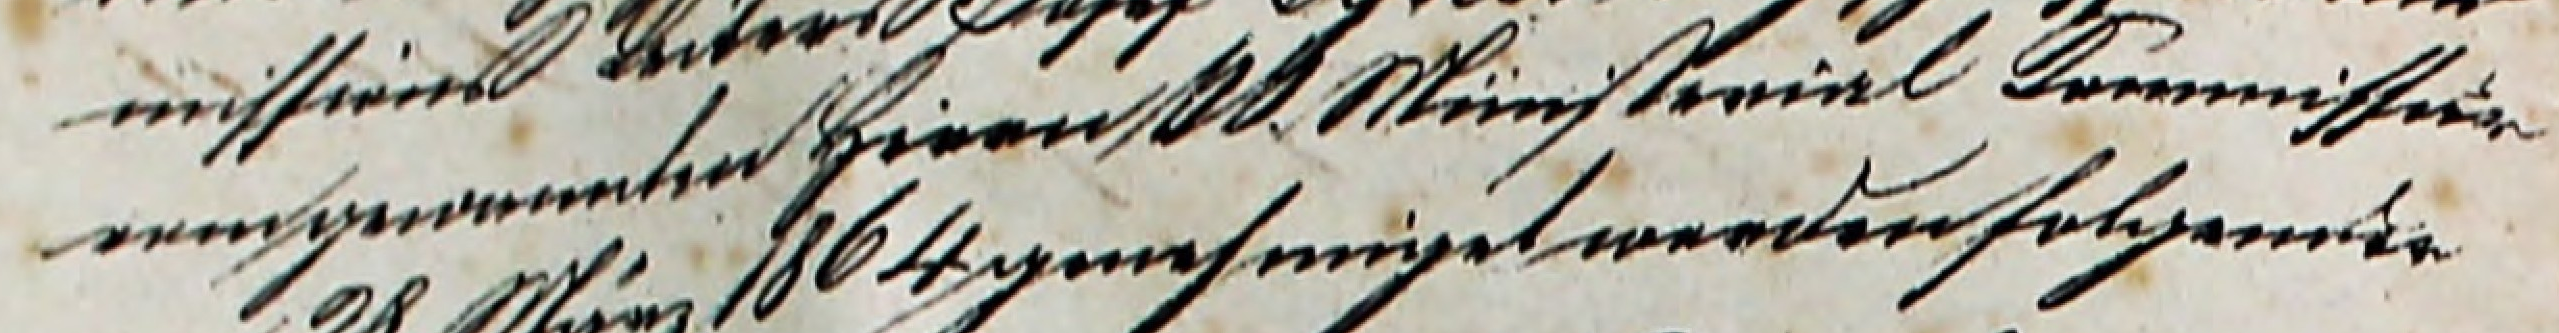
vom gewannten Herrn kk. Ministerial Kommissär
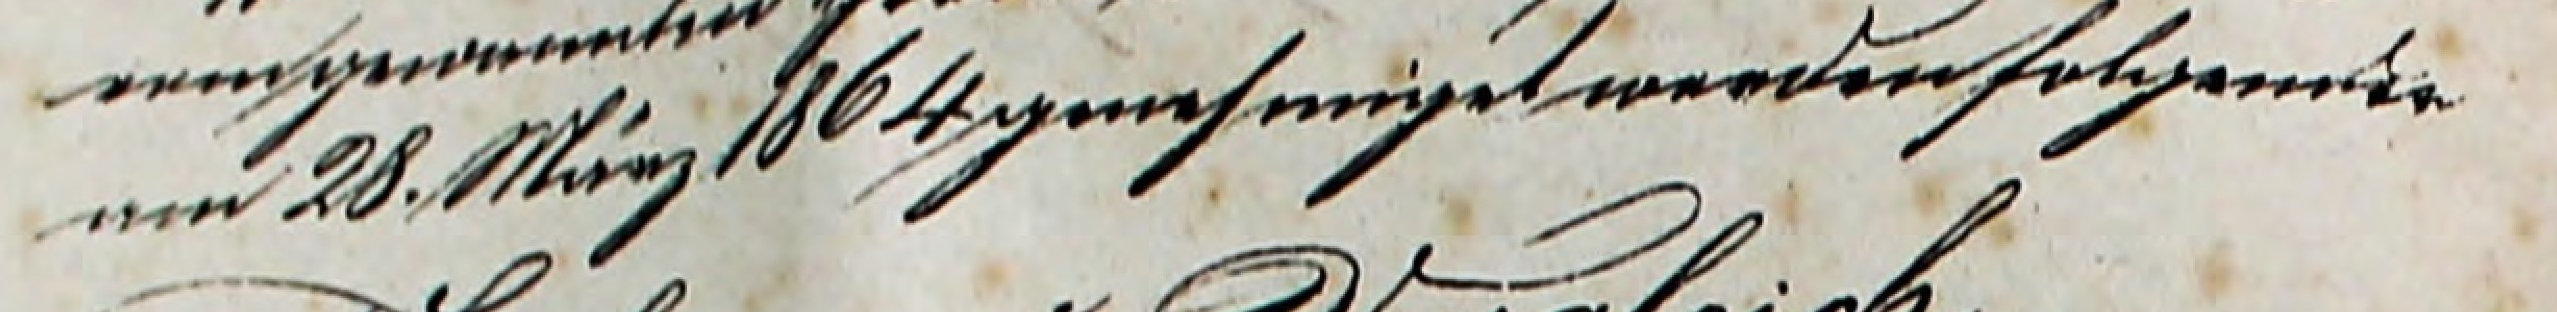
am 28. März 1864 genehmiget werden folgenden
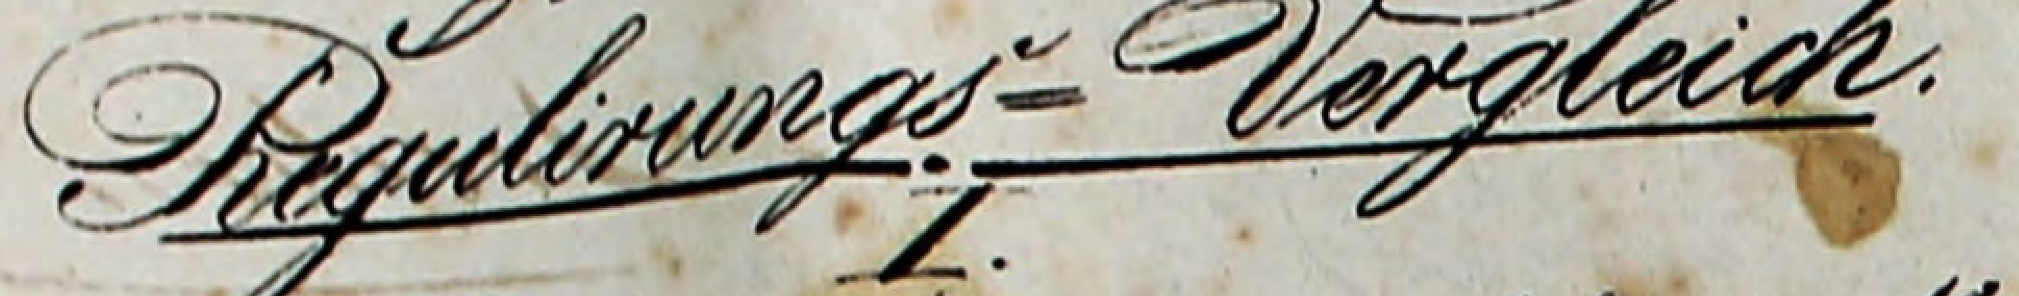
Regulirungs = Vergleich.
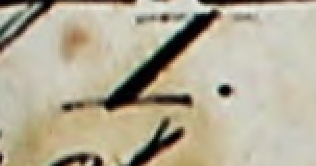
I.
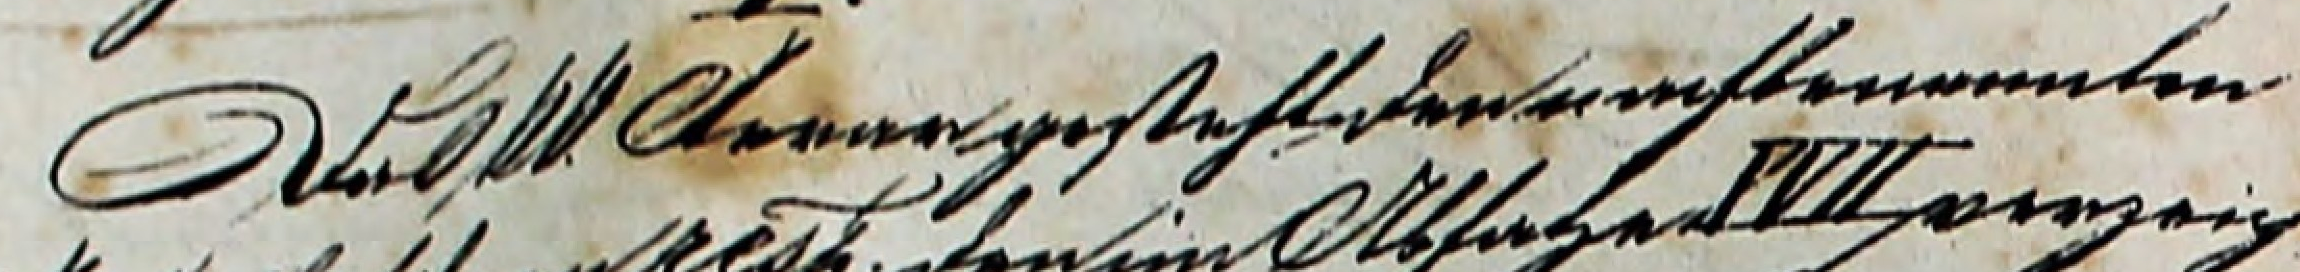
Das kk. Aerar gesteht den nachbenannten
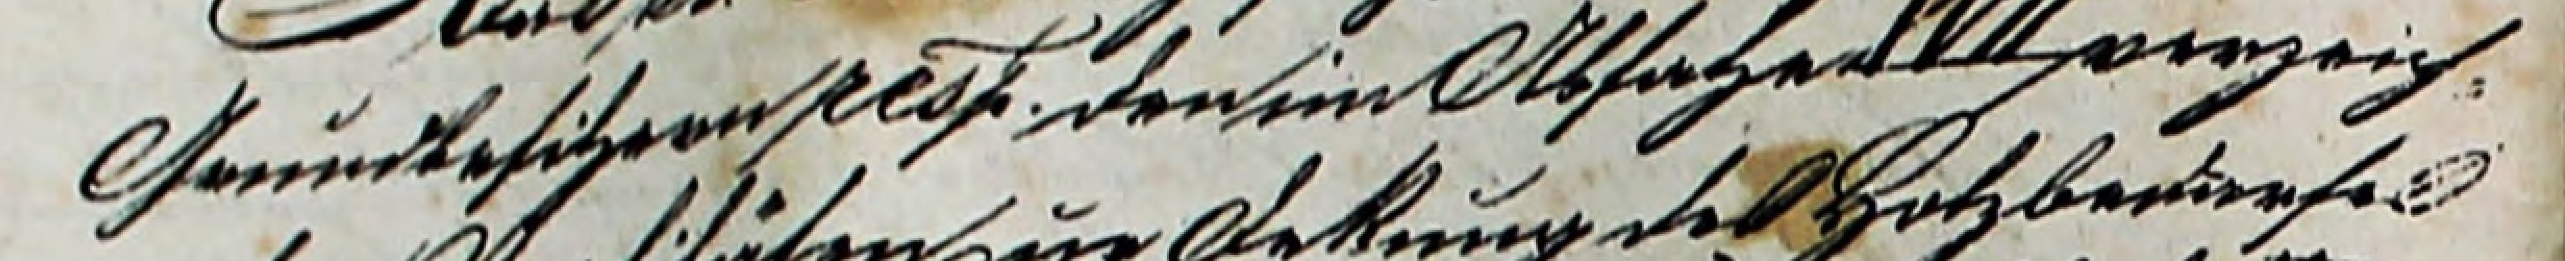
Grundbesitzern resp. den im Absage XVII verzeich=
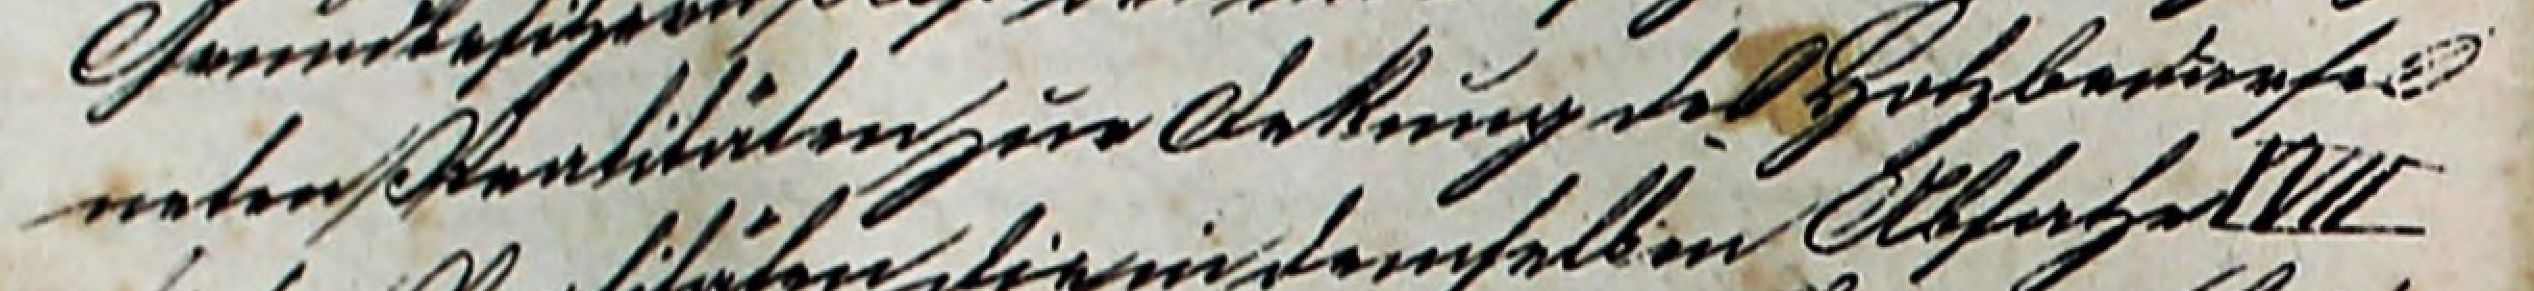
neten Realitäten zur Jekung des Holzbeuerfes
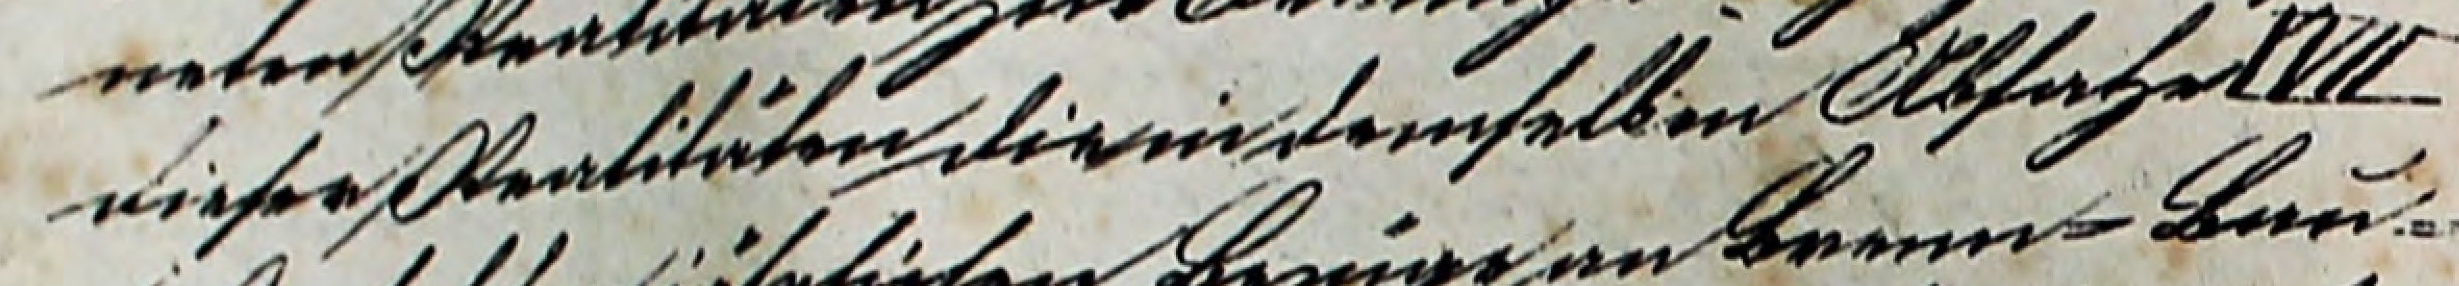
dieser Realitäten die in demselben Absatze XVII
